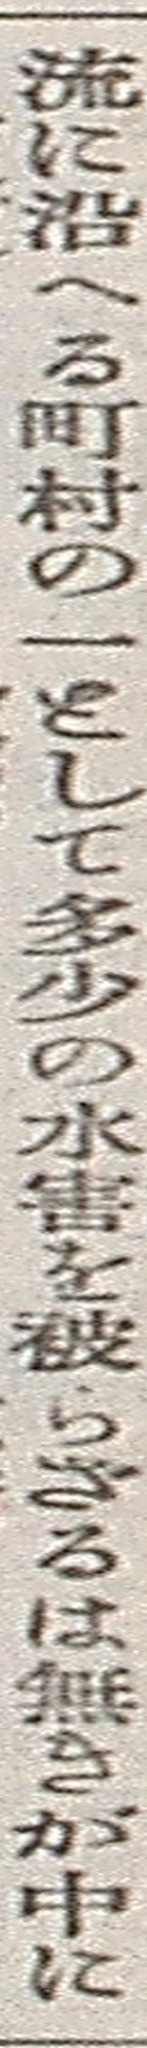流に沿へる町村の一として多少の水害を被らざるは無きが中に
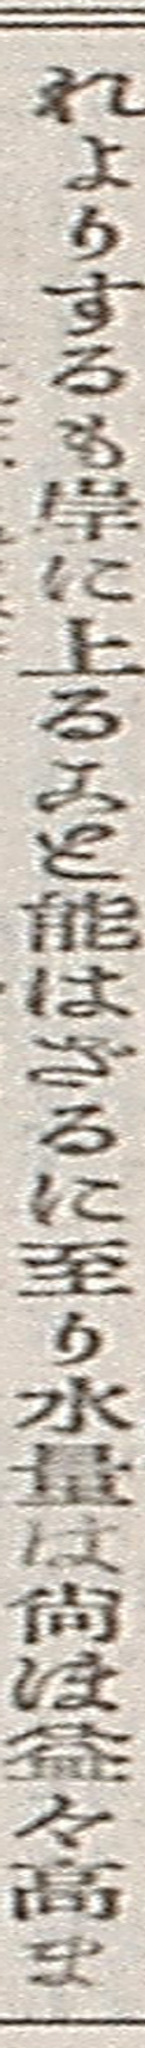れよりするも岸に上ること能はざるに至り水量は尚ほ益々高ま
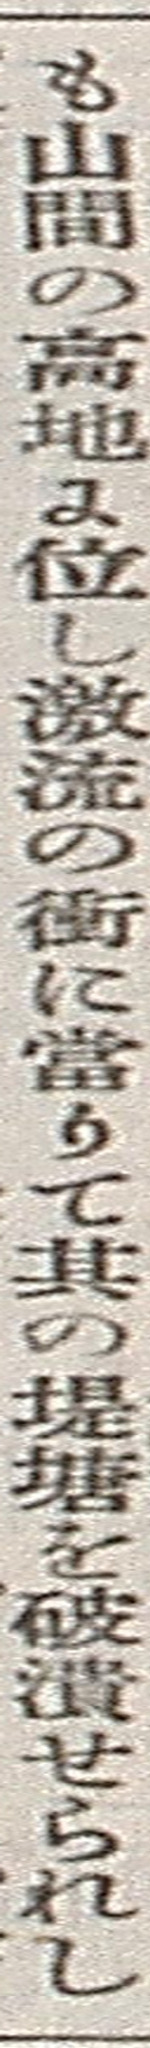も山間の高地に位し激流の衝に当りて其の堤塘を破潰せられし
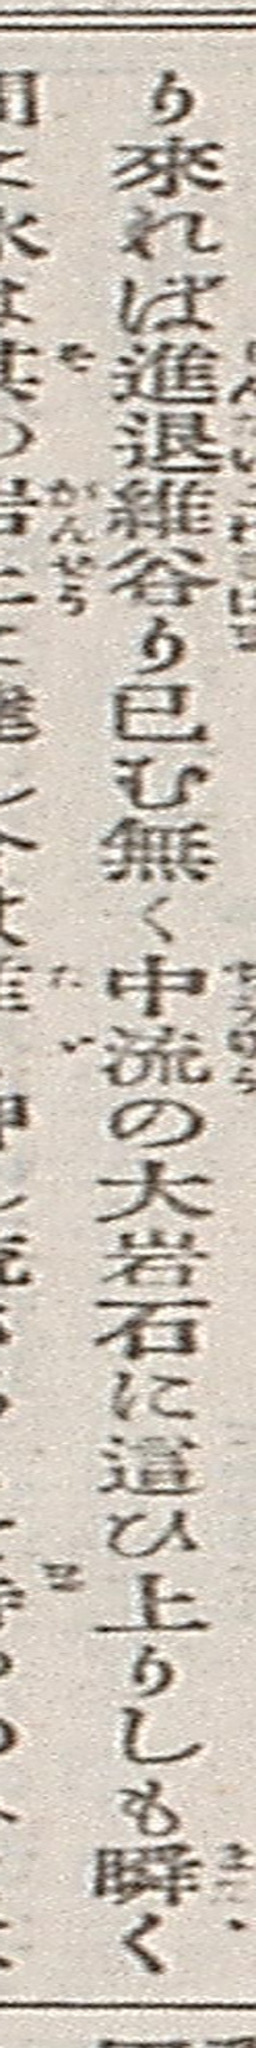り来れば進退維谷り已む無く中流の大岩石に這ひ上りしも瞬く
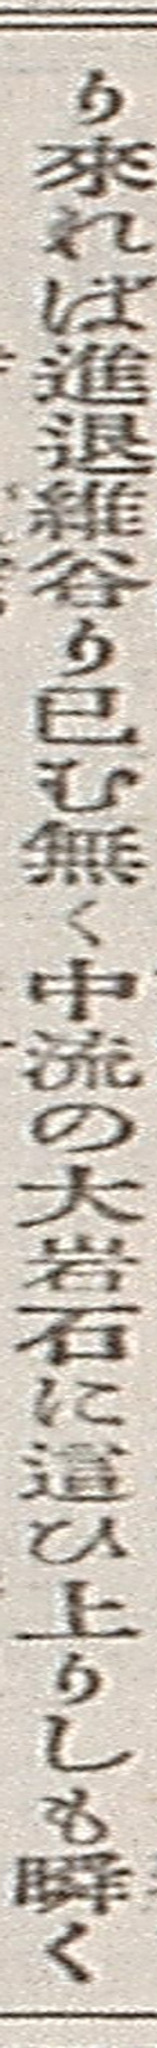り来れば進退維谷り已む無く中流の大岩石に這ひ上りしも瞬く
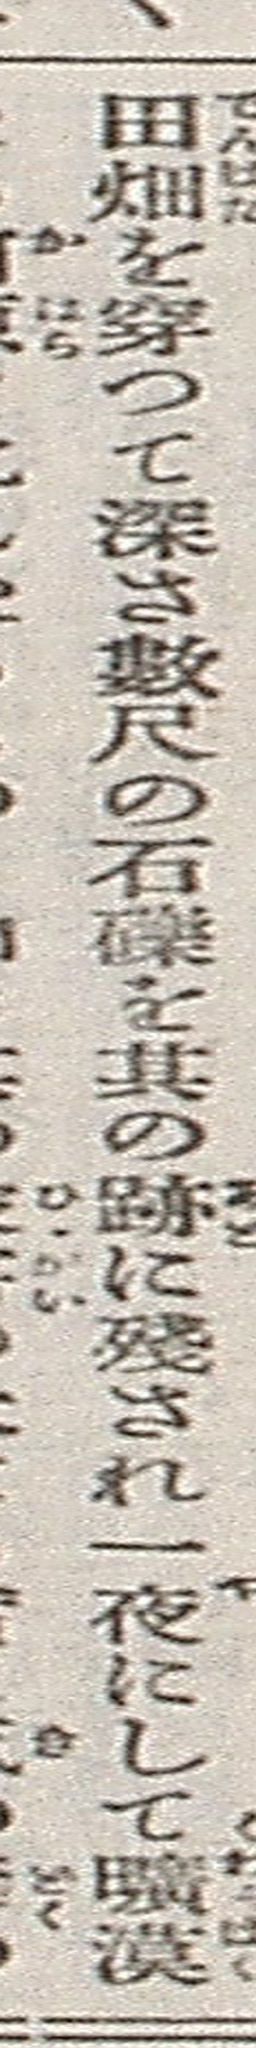田畑を穿つて深さ数尺の石礫を其の跡に残され一夜にして曠漠
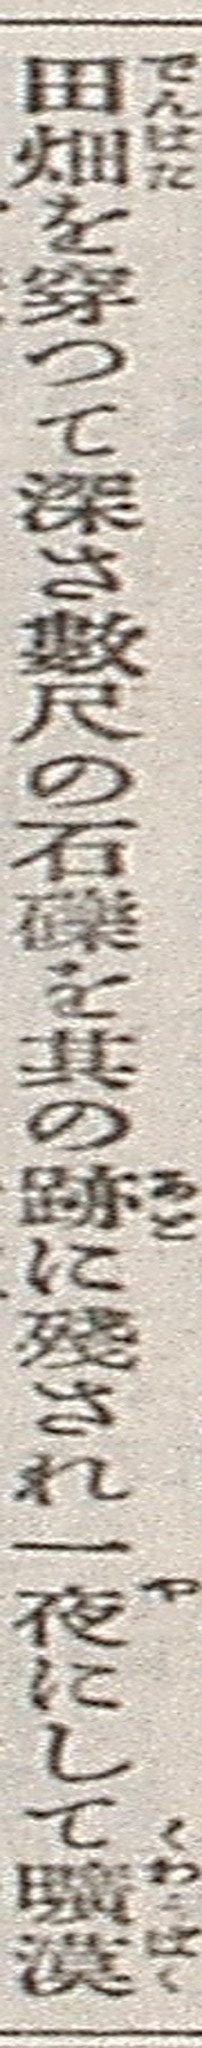田畑を穿つて深さ数尺の石礫を其の跡に残され一夜にして曠漠
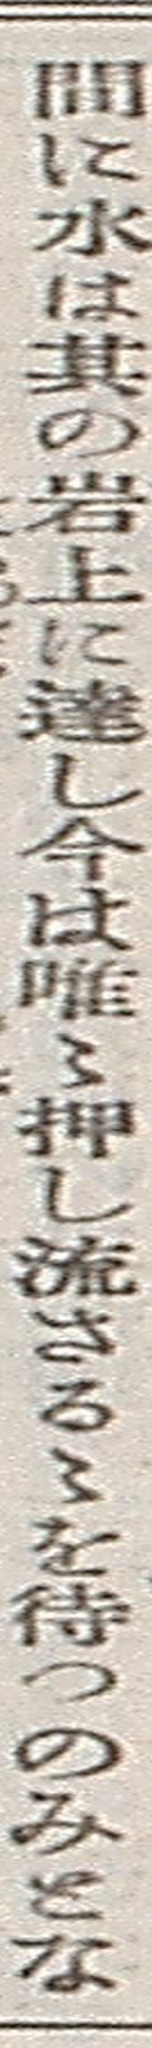間に水は其の岩上に達し今は唯々押し流さるゝを待つのみとな
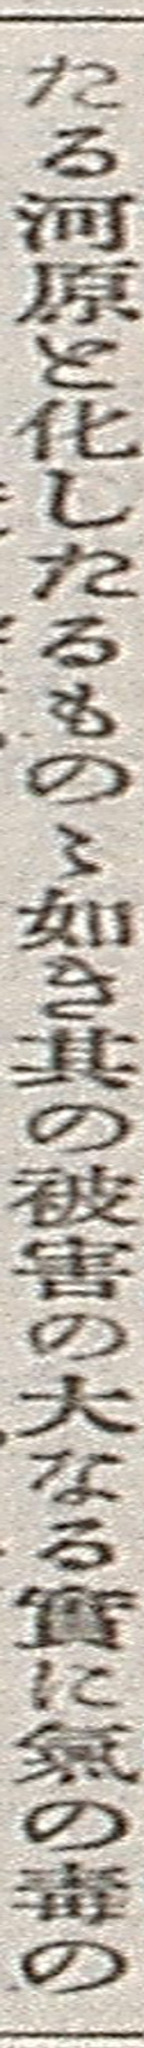たる河原と化したるものゝ如き其の被害の大なる実に気の毒の
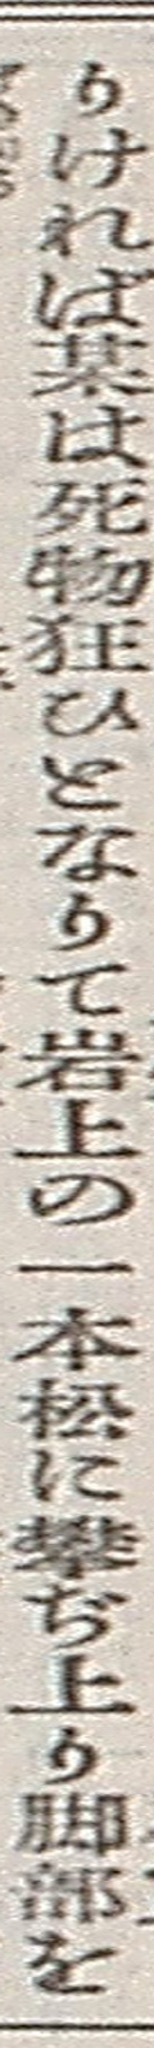りければ某は死物狂ひとなりて岩上の一本松に攀ぢ上り脚部を
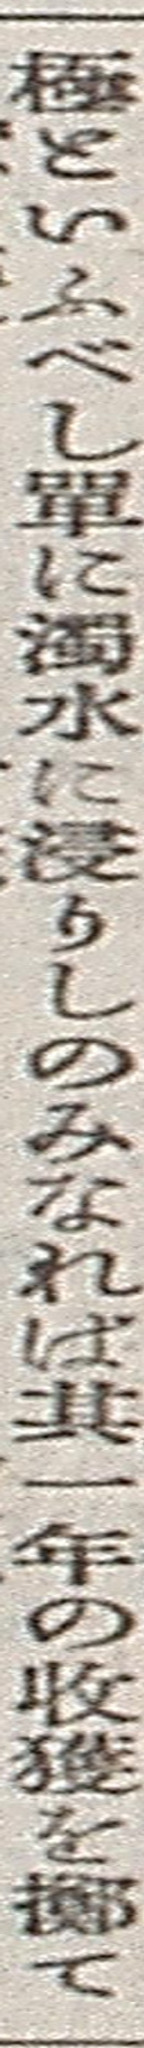極といふべし単に濁水に浸りしのみなれば其一年の収穫を擲て
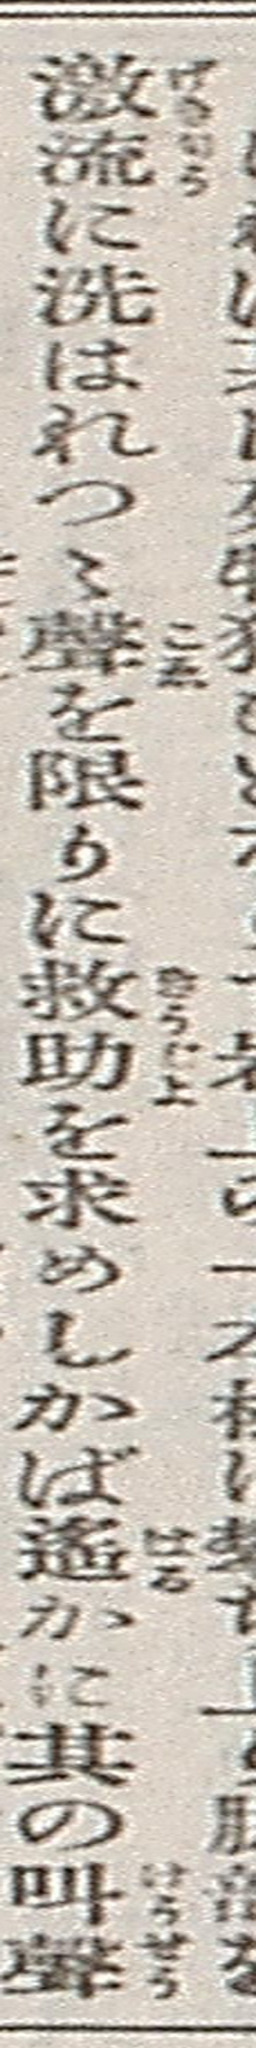激流に洗はれつゝ声を限りに救助を求めしかば遥かに其の叫声
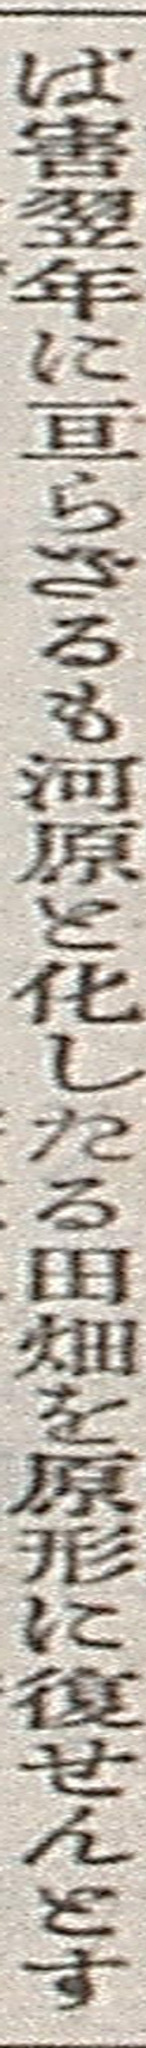ば害翌年に亘らざるも河原と化したる田畑を原形に復せんとす
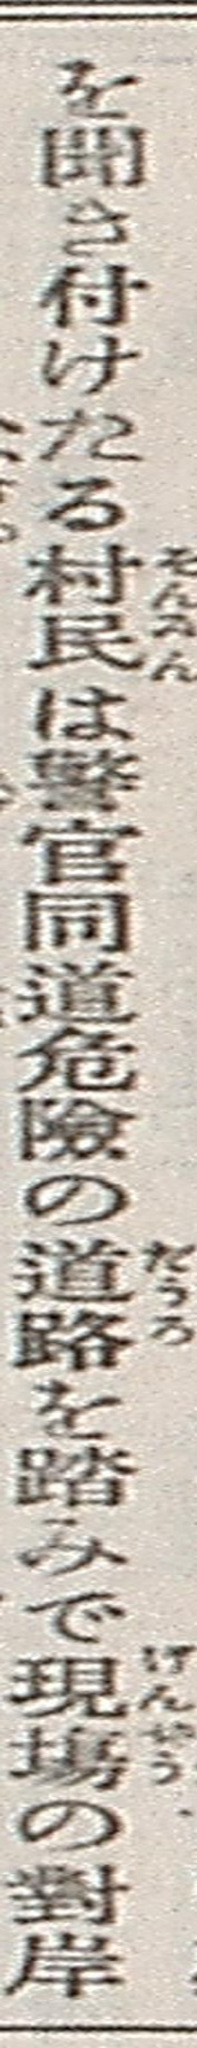を聞き付けたる村民は警官同道危険の道路を踏みで現場の対岸
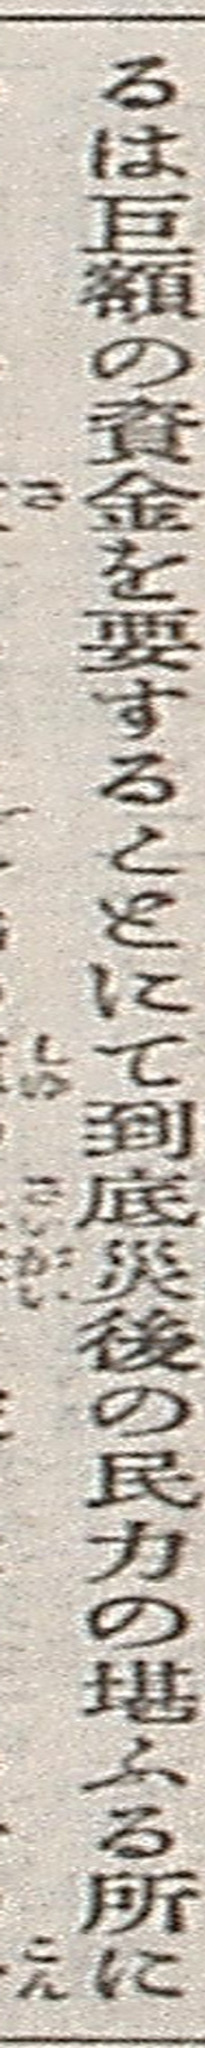るは巨額の資金を要することにて到底災後の民力の堪ふる所に
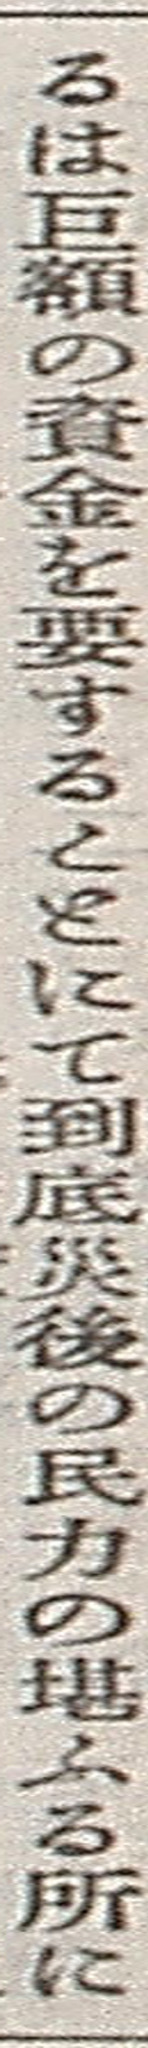るは巨額の資金を要することにて到底災後の民力の堪ふる所に
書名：風俗畫報臨時増刊第百二十八號　洪水被害録（下）
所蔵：東京大学地震研究所図書室 Earthquake Research Institute Library, The University of Tokyo, JAPAN
